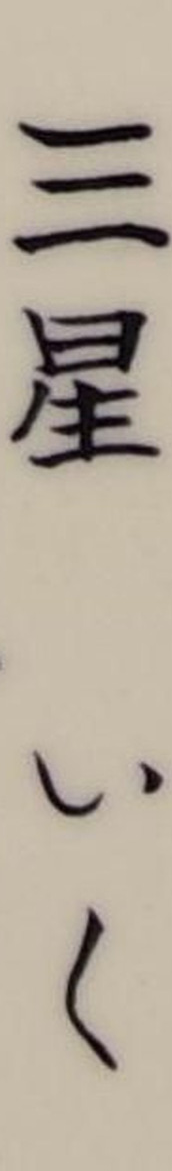三星いく
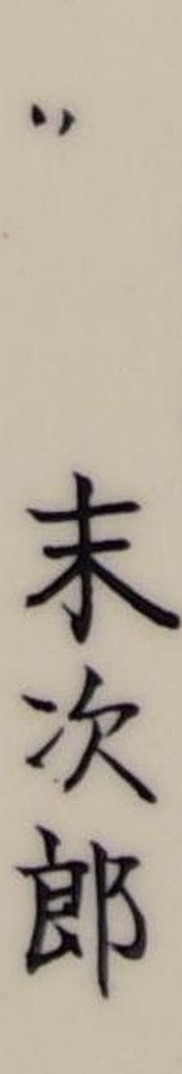末次郎
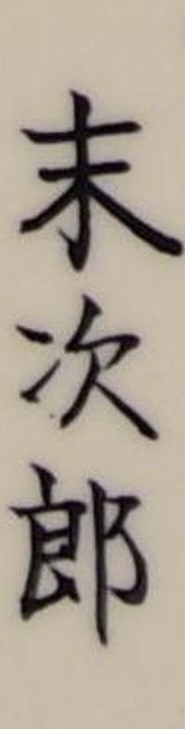末次郎
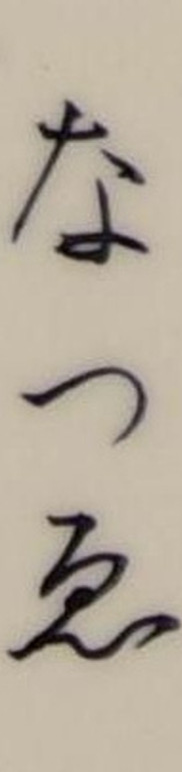なつえ
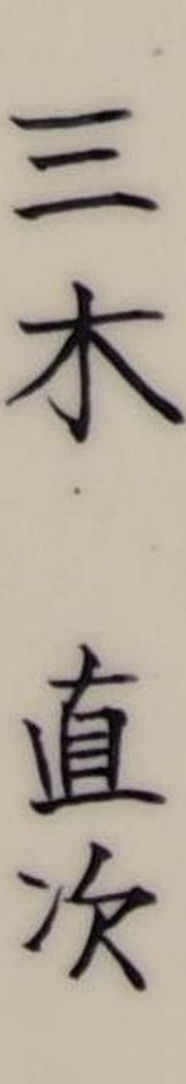三木直次
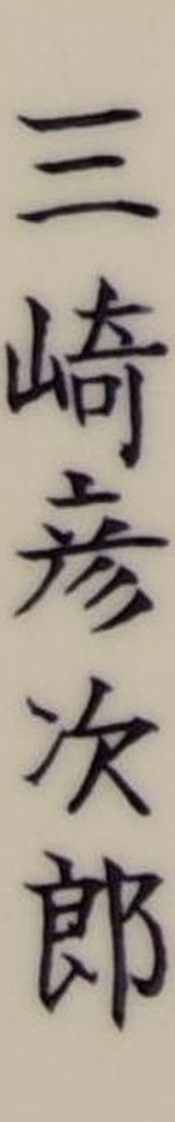三崎彦次郎
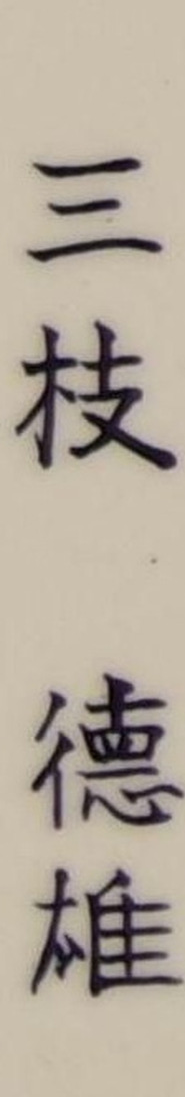三枝徳雄
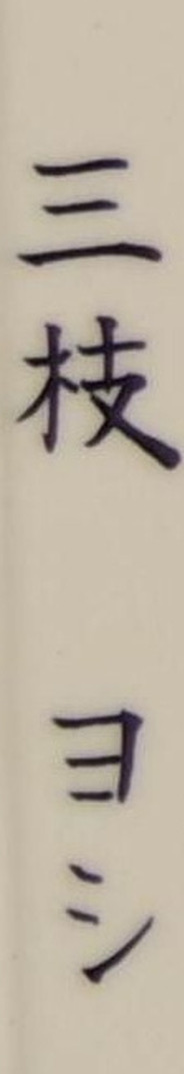三枝ヨシ

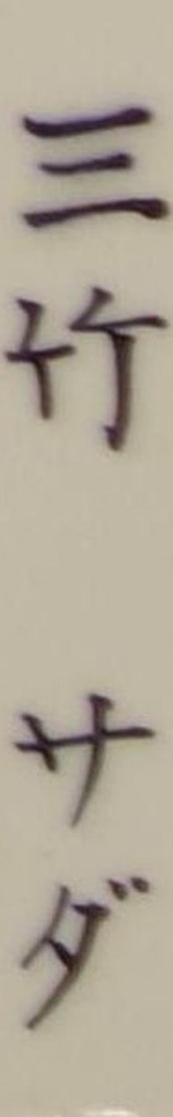三竹サダ
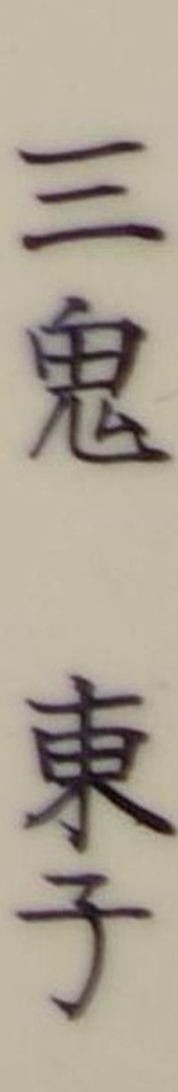三鬼東子
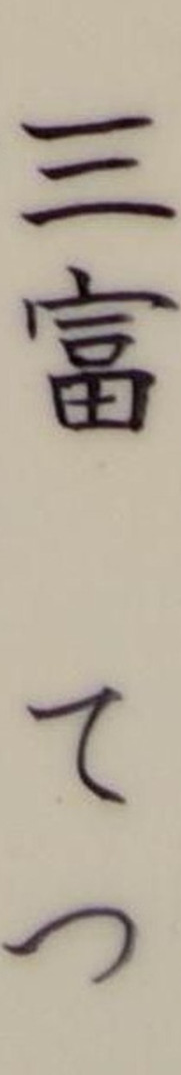三富てつ
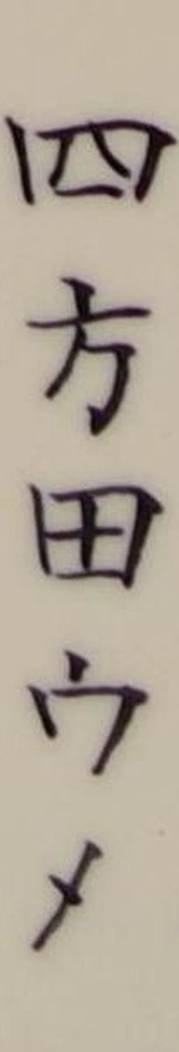四方田ウメ
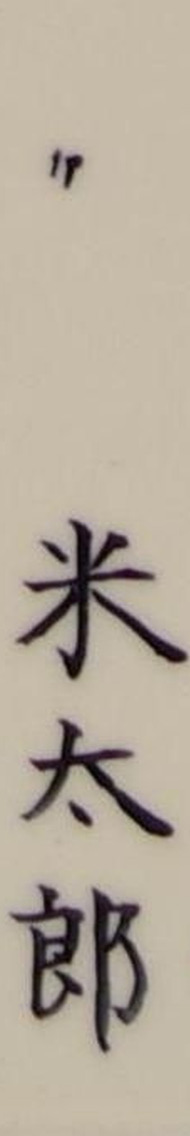米太郎
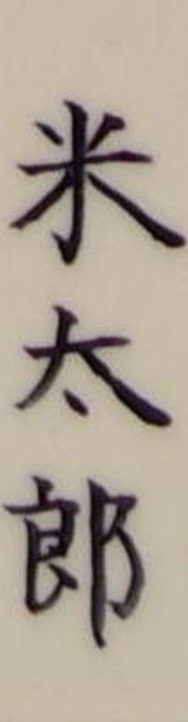米太郎
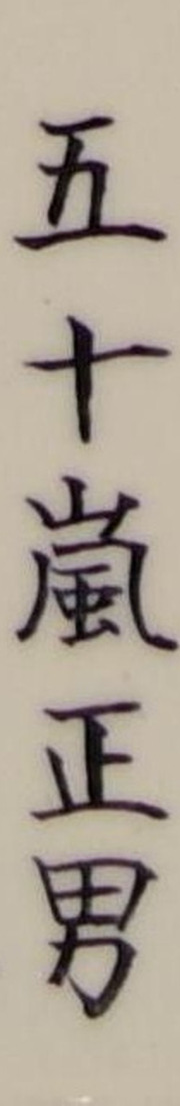五十嵐正男
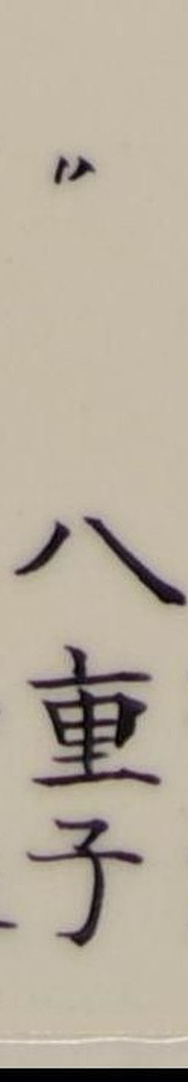八重子
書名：E~L
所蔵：高野山金剛峯寺
